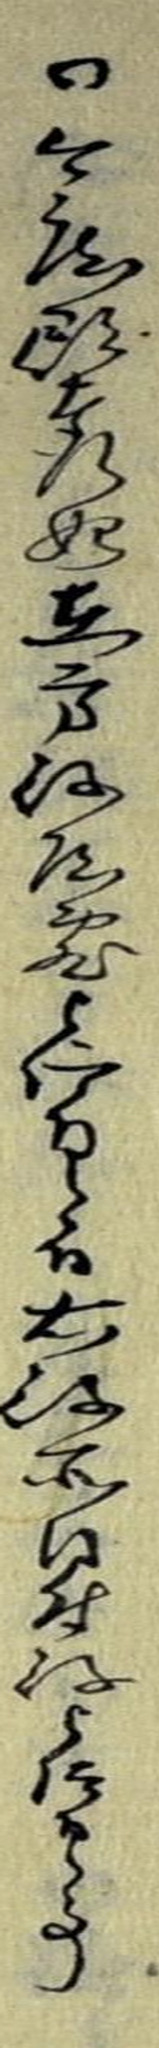〇今度郡奉行始在方役屋敷被仰付候に付右役所目付役被仰付候事
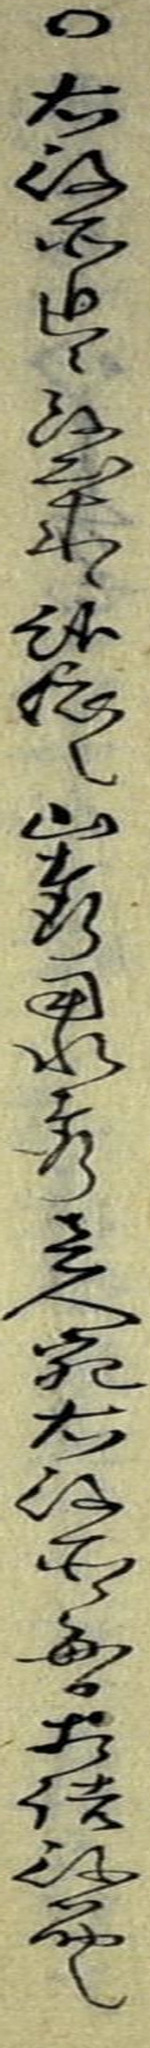〇右役所追々致出来候趣依之山奉行用水奉行壱人宛右役所へ毎日相詰役筋之
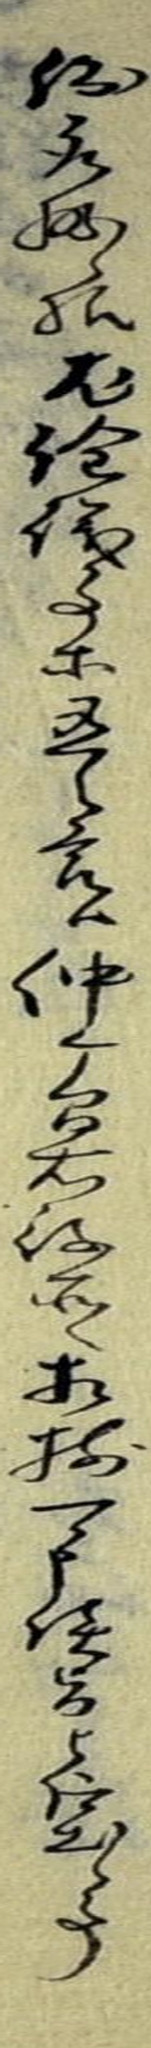儀取扱候様尤詮儀事等有之節は仲ヶ間右役所へ相揃可申談旨被仰出候事
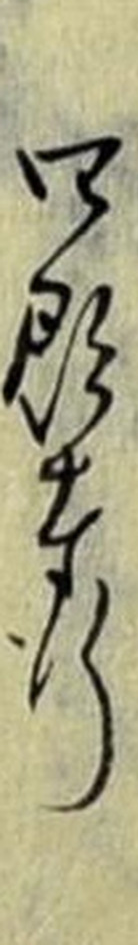四郡奉行
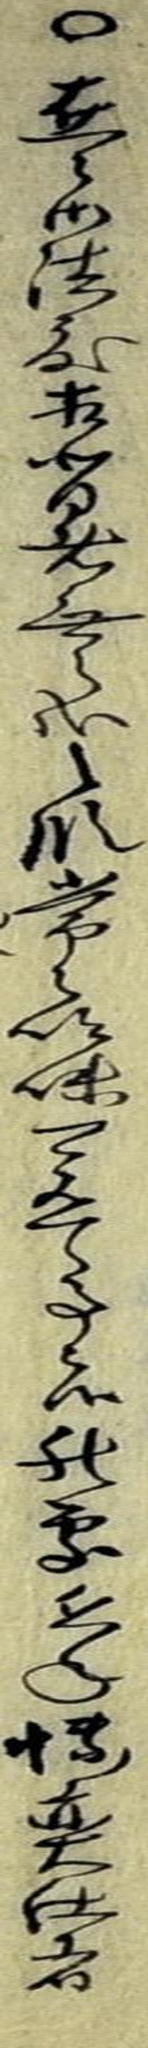〇在々御法度相背者無之哉之段常々吟味可有之事に候然処近年博奕仕者
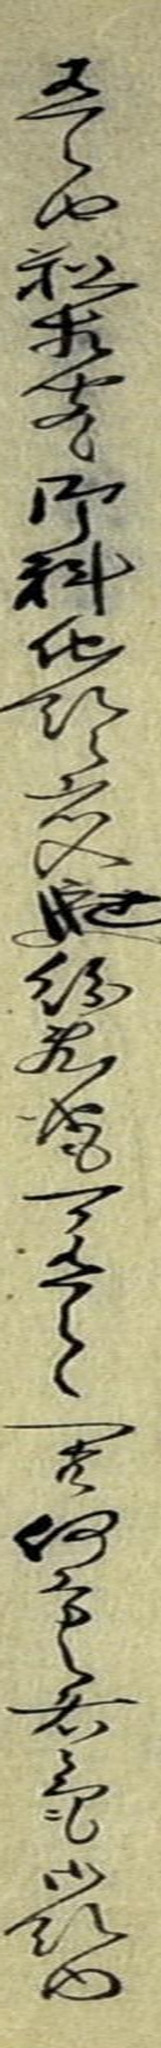有之由粗相聞候御料他領之者入交込紛敷儀も可有之候へ共何方之者に而も御領内
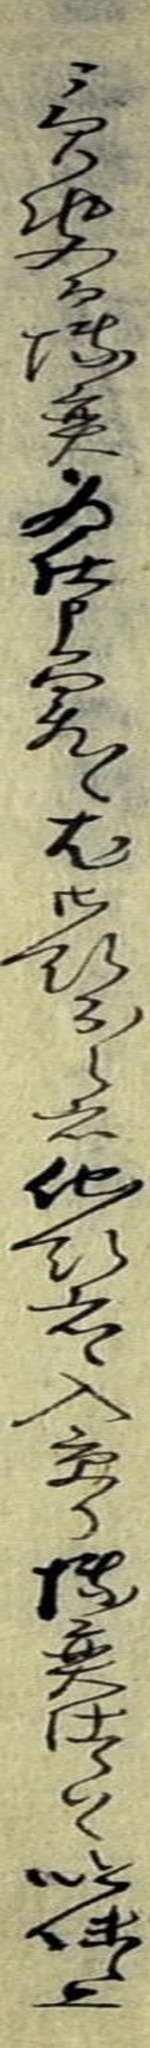に而は決而博奕為仕申間敷候尤御領分之者他領者へ入交り博奕仕候はゝ吟味之上
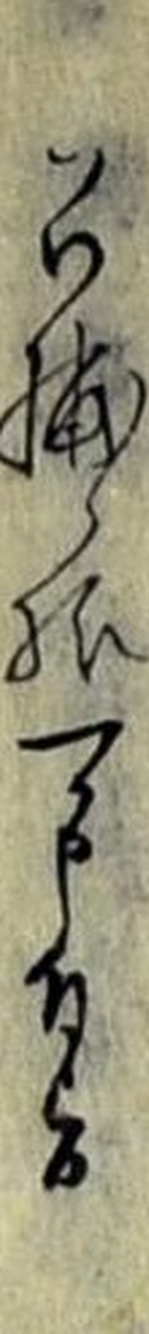召捕候様可申付旨
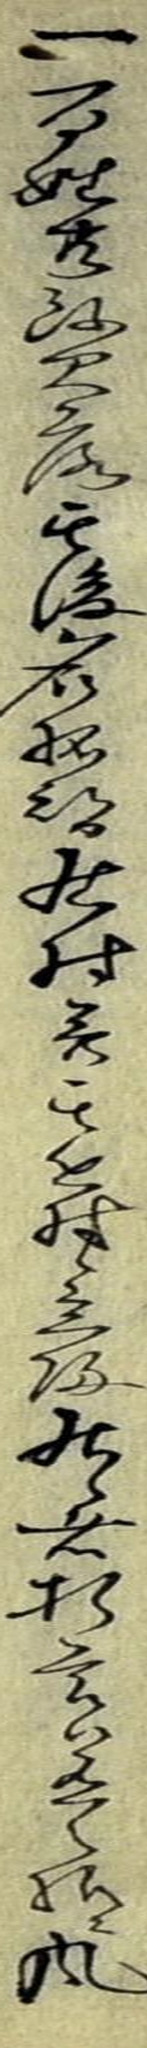一百姓共致欠落其後名抔替居村并其近村へ立帰居候者折節は有之様に風
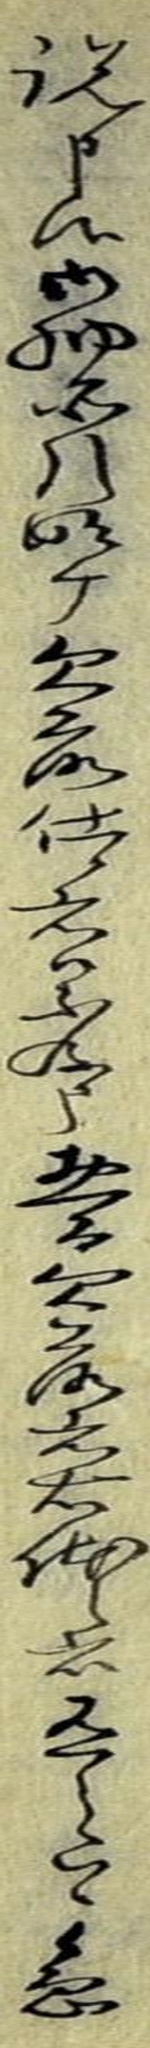説申候御納所引明ケ欠落仕候者は不及申惣而欠落者右体之者有之候はゝ急
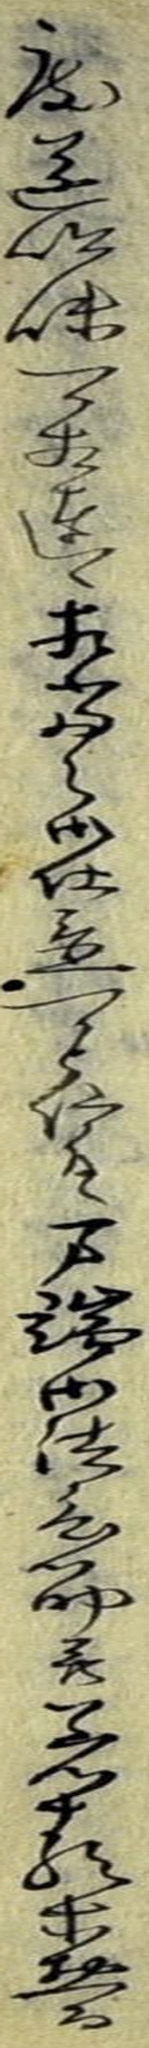度遂吟味可相達候相当之御仕置可被仰付候万端御法度筋并着類抔惣而
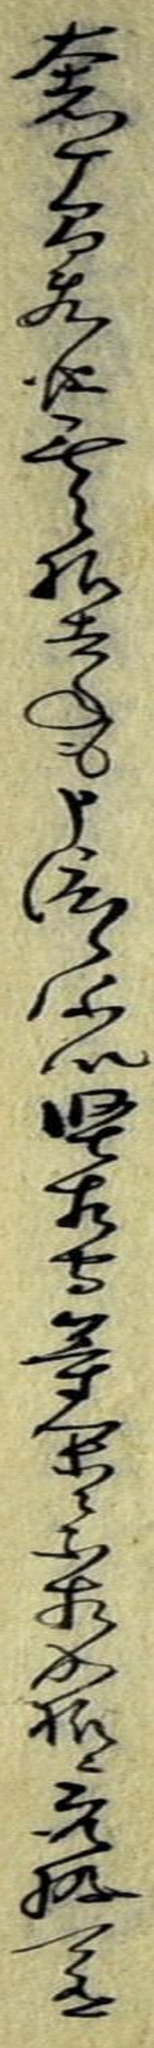奢ヶ間敷儀無之様去年も申渡候弥以堅相守等閑に不相成様に取扱可有

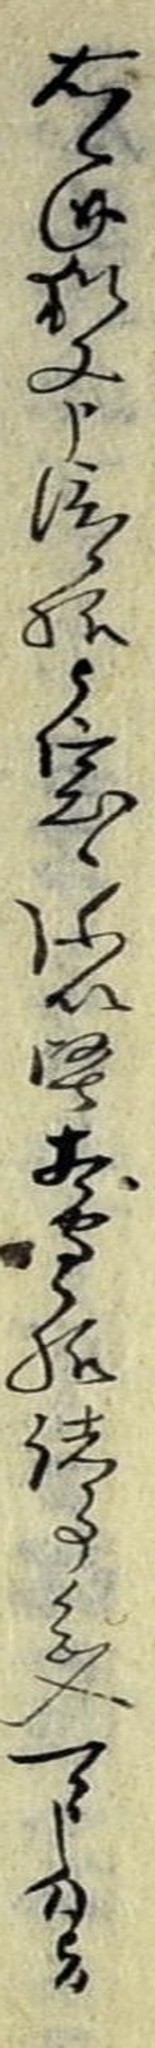右之趣猶又申渡候様被仰出候弥以堅相守候様諸事念入可申付旨
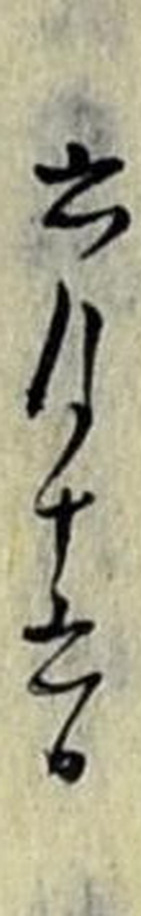六月十六日
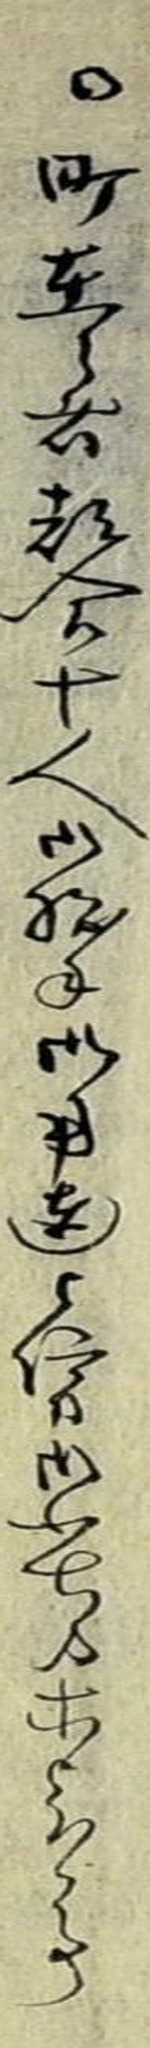〇町在之者都合十人御勝手御用達被仰付御ふち方等被下候事
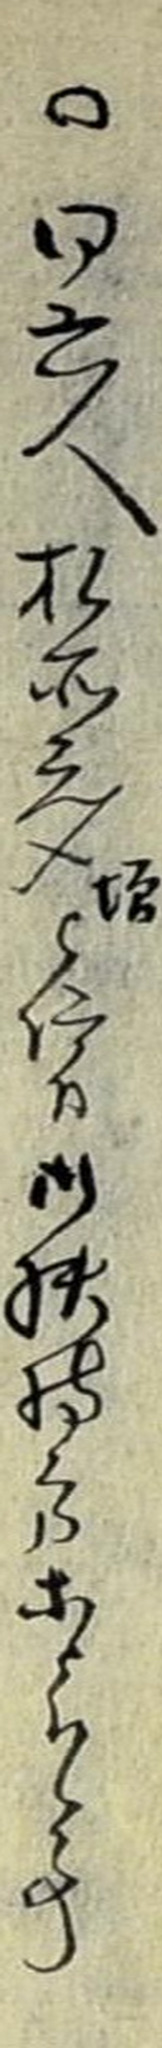〇同六人札所元〆増被仰付御扶持方等被下候事
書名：命令之部 二
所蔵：福井県文書館 Fukui Prefectural Archives
